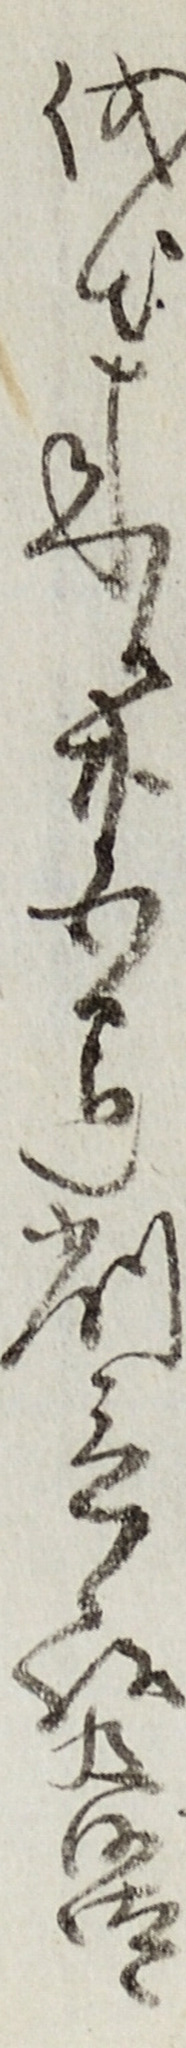伐出来ル廿五日迄削立候様及沙汰候
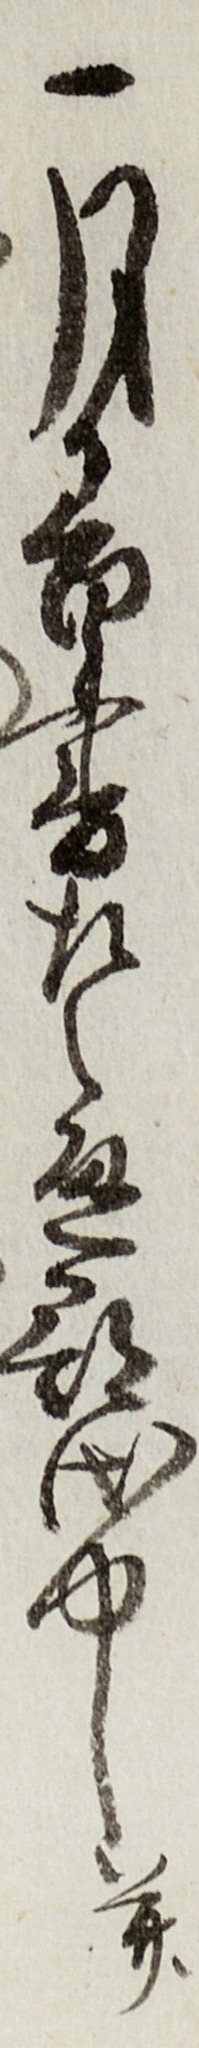一月番書左之通郡代中并
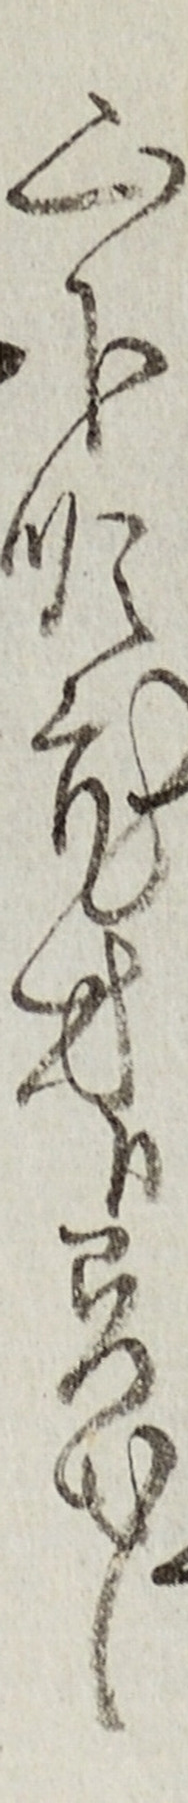山下順蔵方江差出候
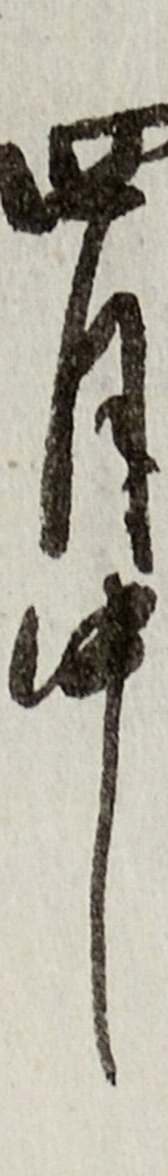四月中

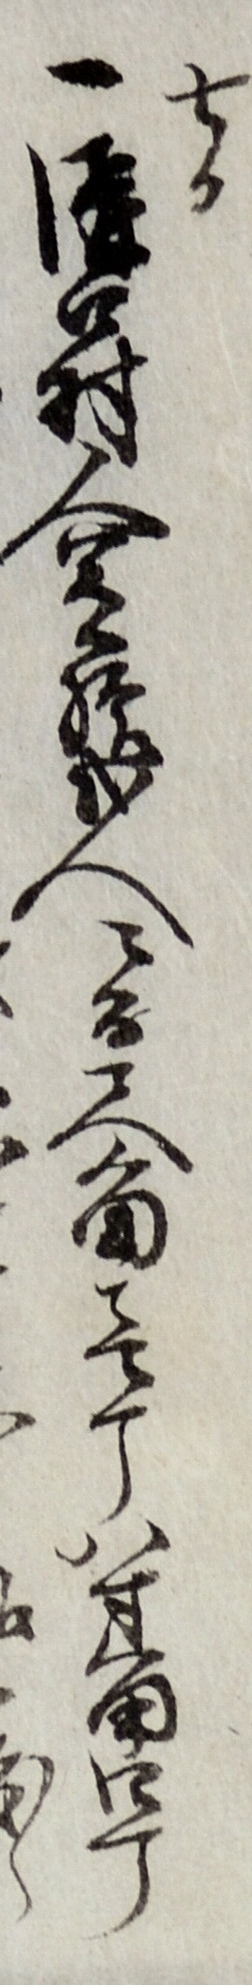一溝口村人足拾弐人ニ而尺角壱丁八寸角四丁
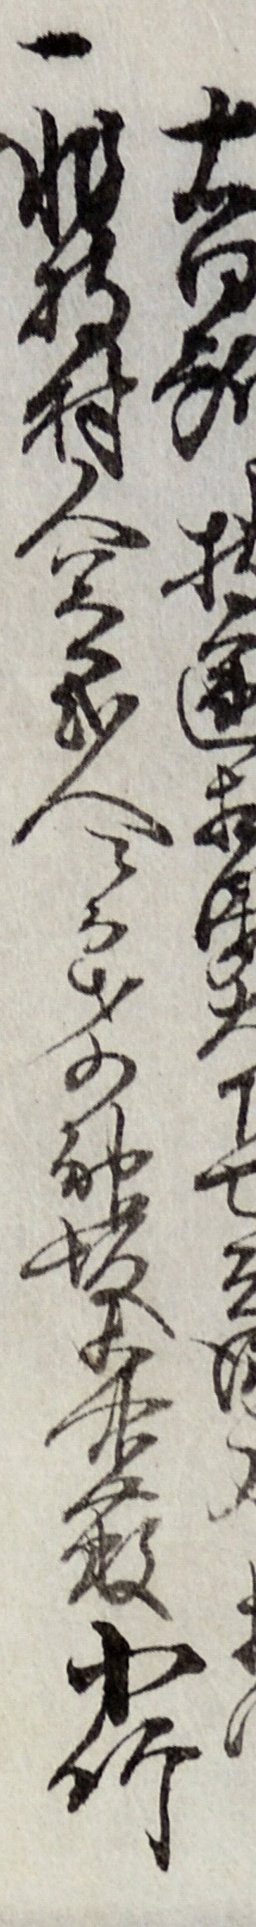一非持村人足弐人ニ而才の神坂御竹薮小竹
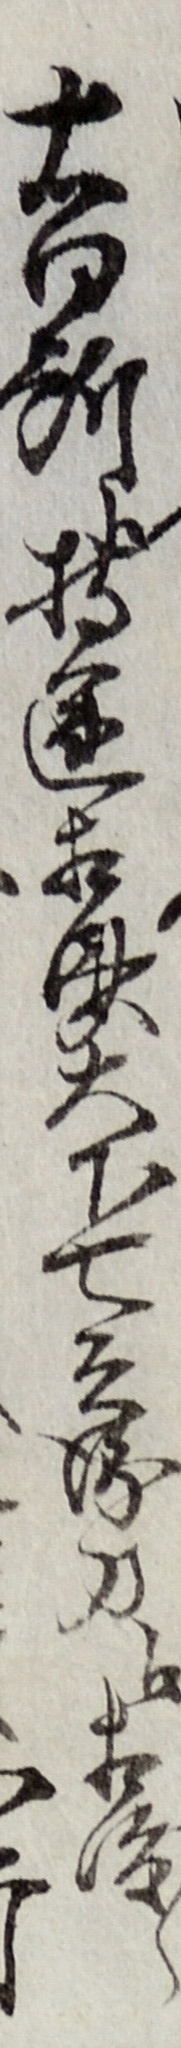右同断江持運相済大下七兵衛方江相渡候
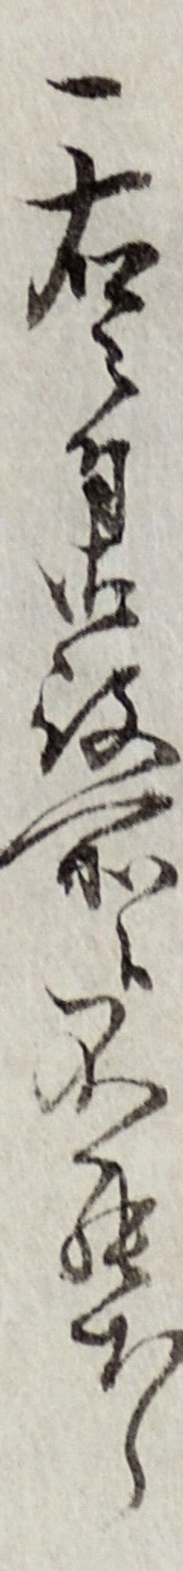一右ニ付御役所江不罷出候
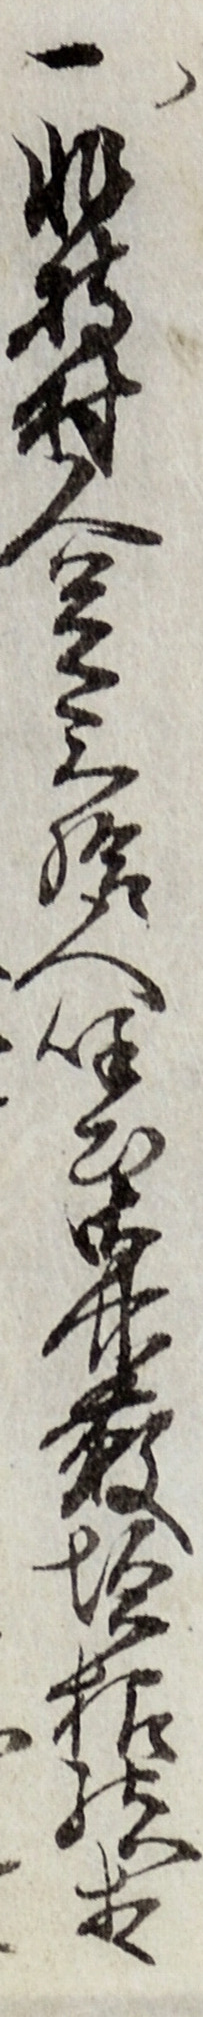一非持村人足三拾人呼出御竹薮垣根結相
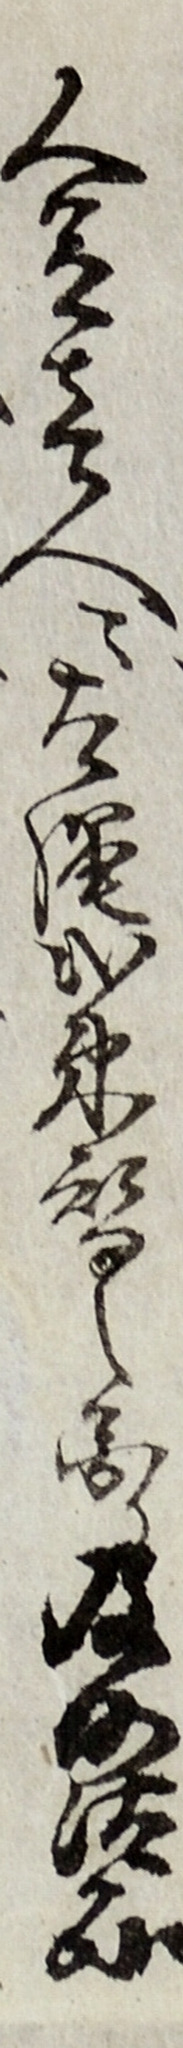人足壱人ニ太縄弐束替候図り及沙汰候処
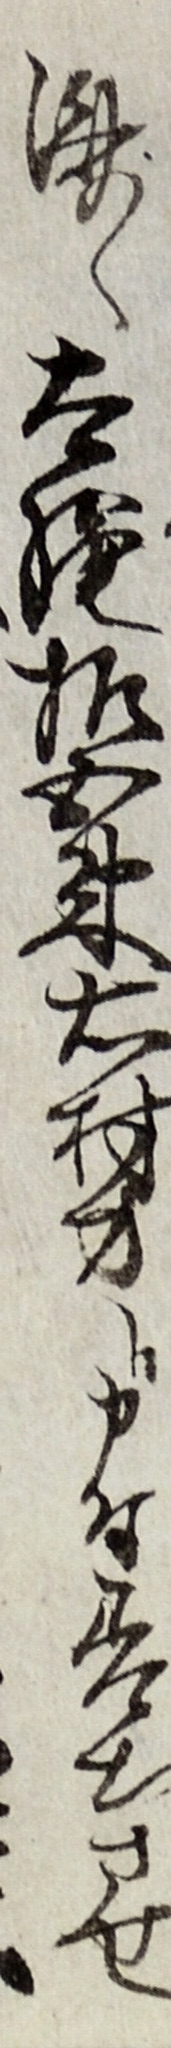済候太縄拾五束右村方江申付差出させ
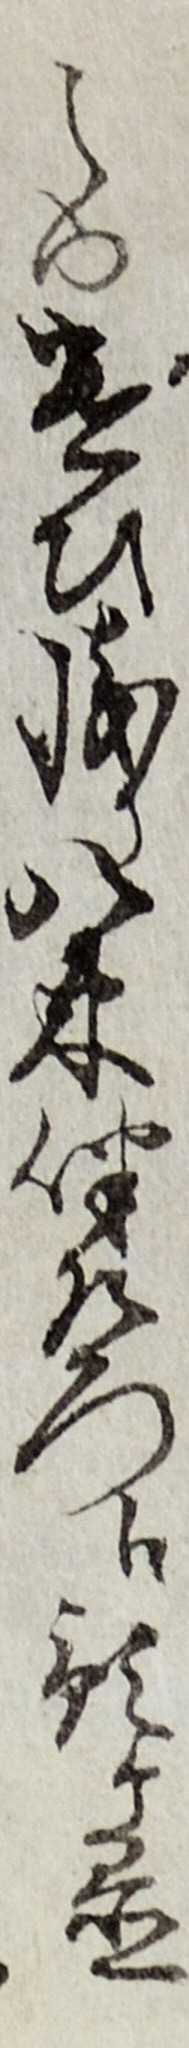之内遣ひ残り八束伴左衛門江預ケ置
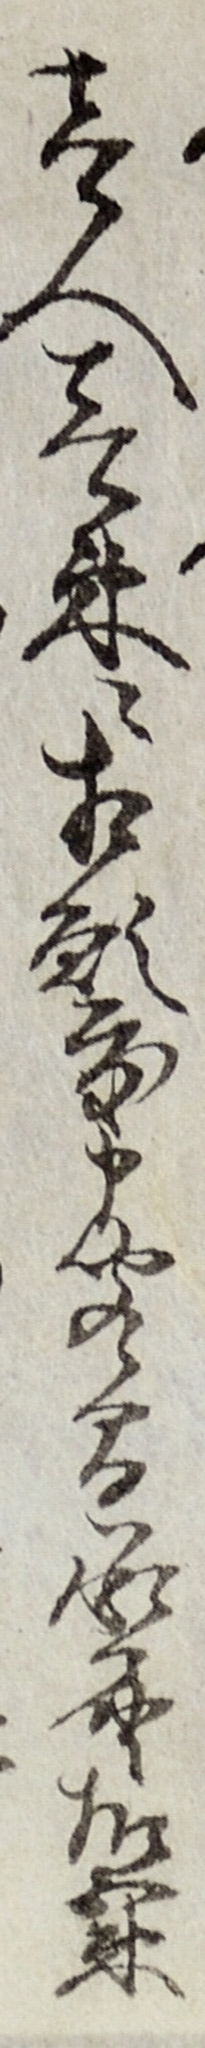壱人壱束ニ相願度申聞候間承届拾五束
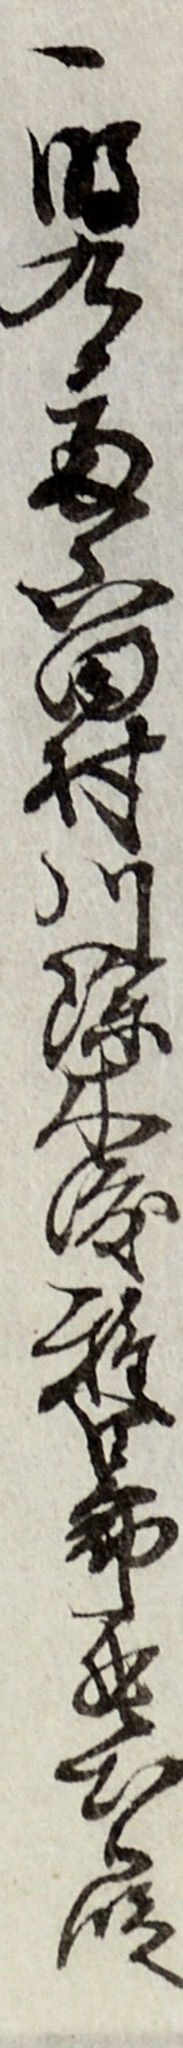一明九日両山田村川除木渡雅四郎罷出候段
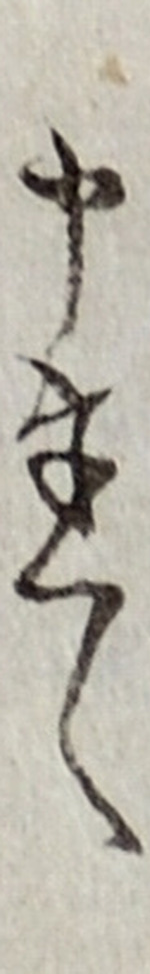申達候
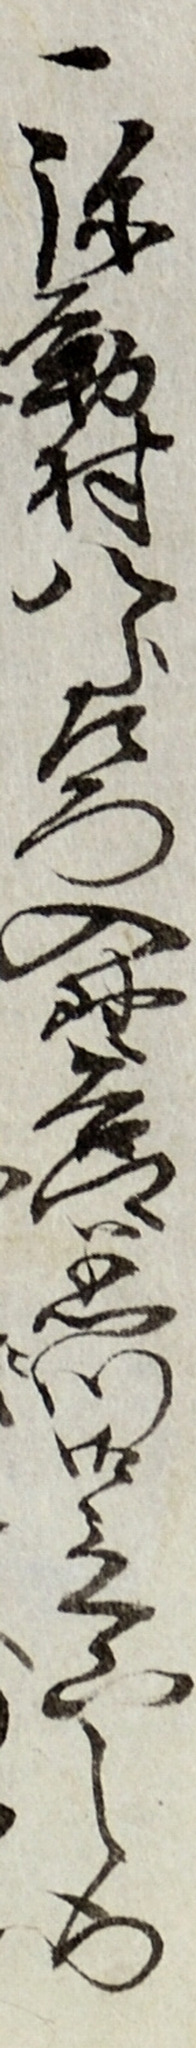一弥勒村八郎左衛門入野谷郷黒川御立山之内
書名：御山方御薪方諸事御用留
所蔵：伊那市立高遠町図書館・合同会社AMANE
